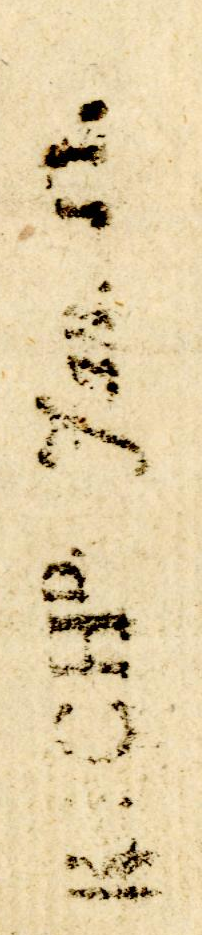K. CH^D Jan. 11
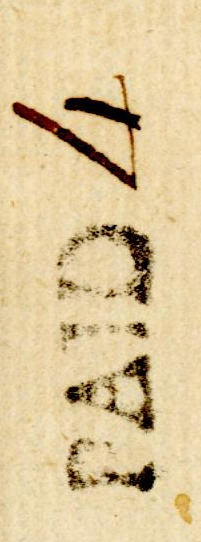PAID 4
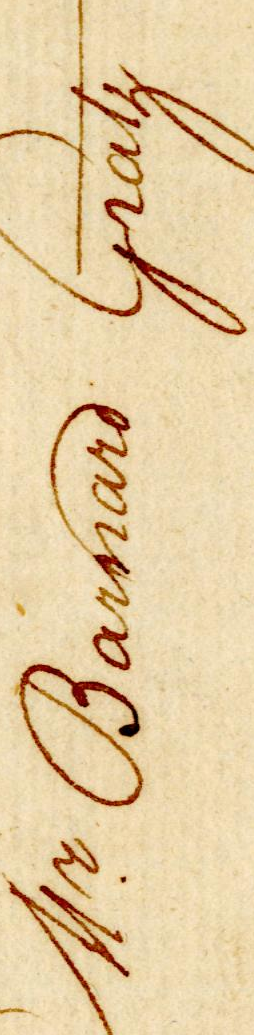M^r. Barnard Gratz
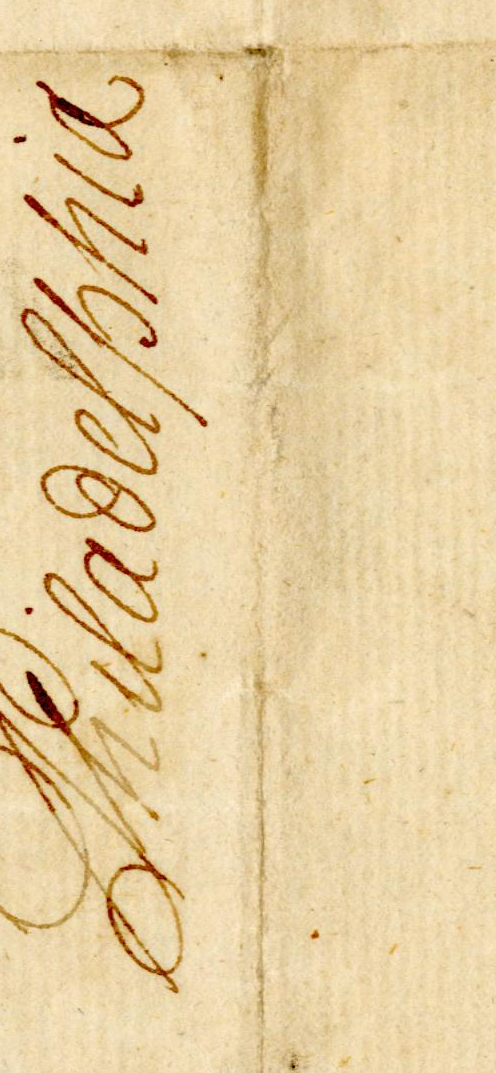Philadelphia
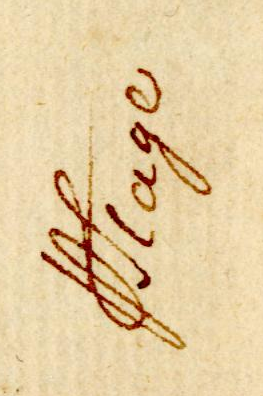per Stage
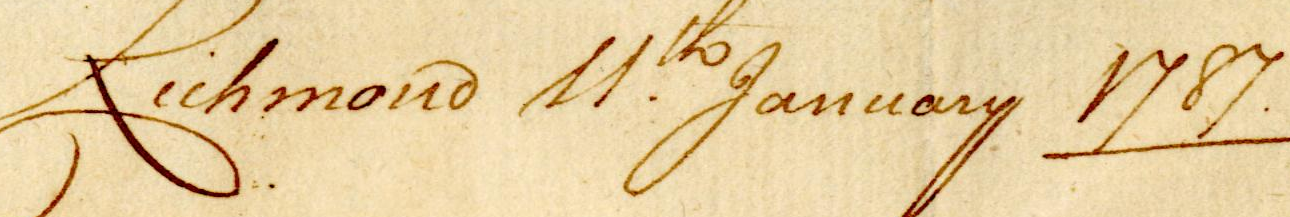Richmond 11^th. January 1787
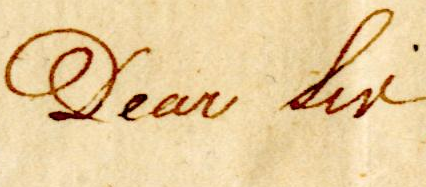Dear Sir
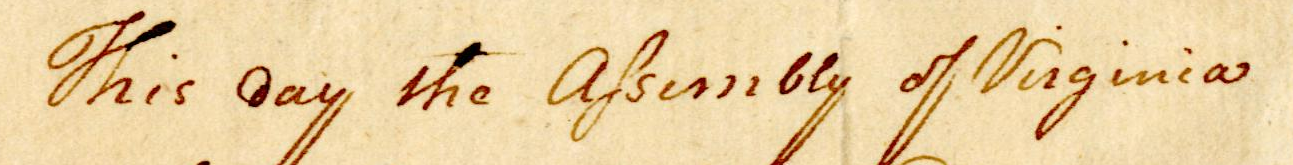This day the Assembly of Virginia
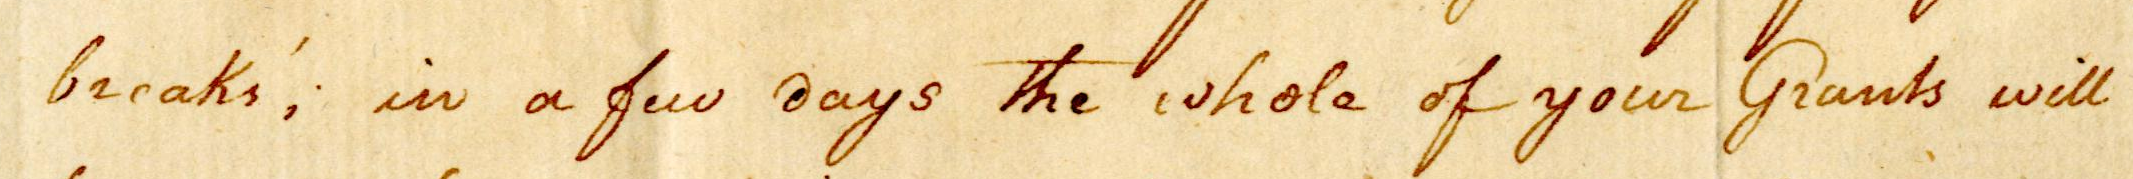breaks, in a few days the whole of your Grants will
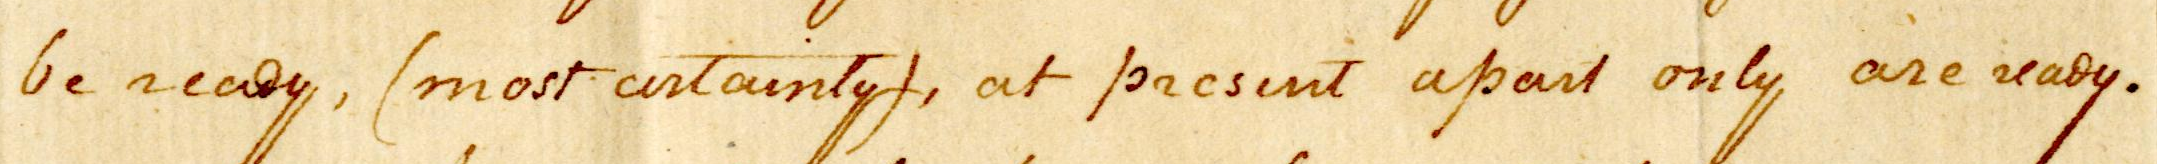be ready, (most certainly), at present about only one ready.
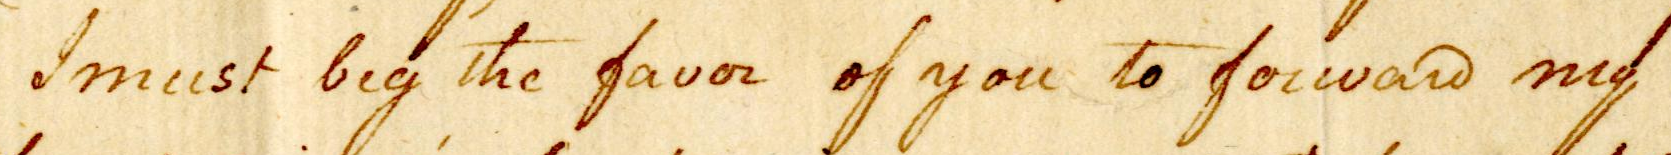I must beg the favor of you to forward my
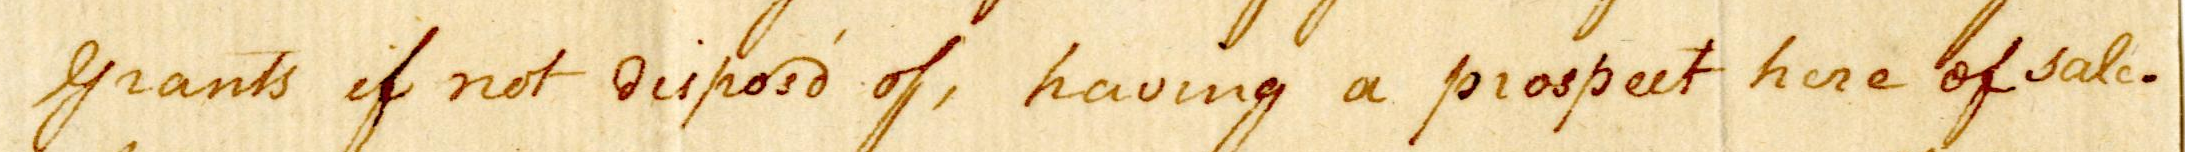Grants if not disposd of, having a prospect here of sale.
